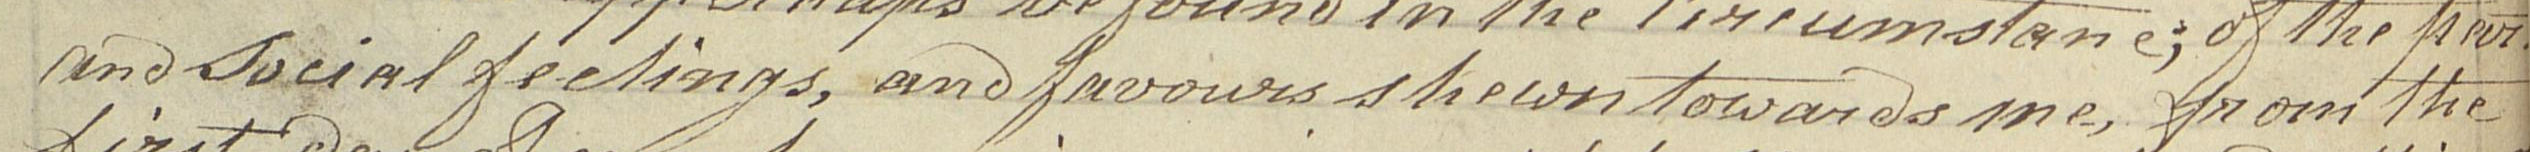and social feelings, and favour shewn towards me, from the
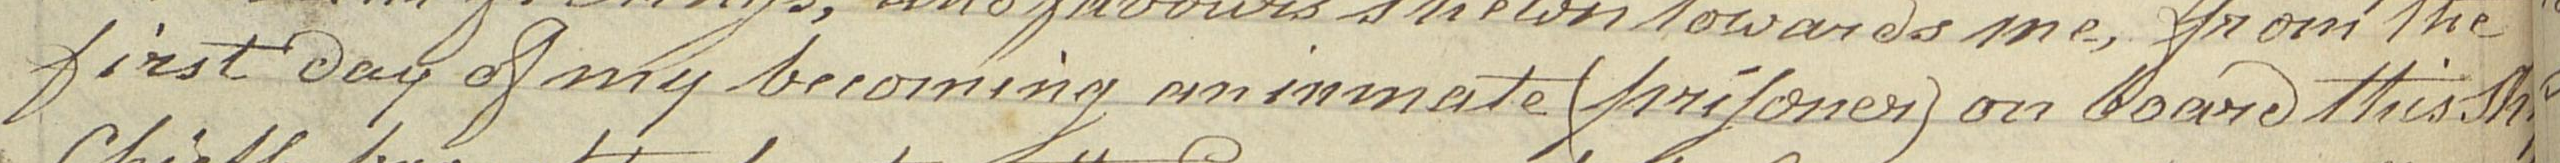first day of my becoming animate (prisoner) on board this sh-
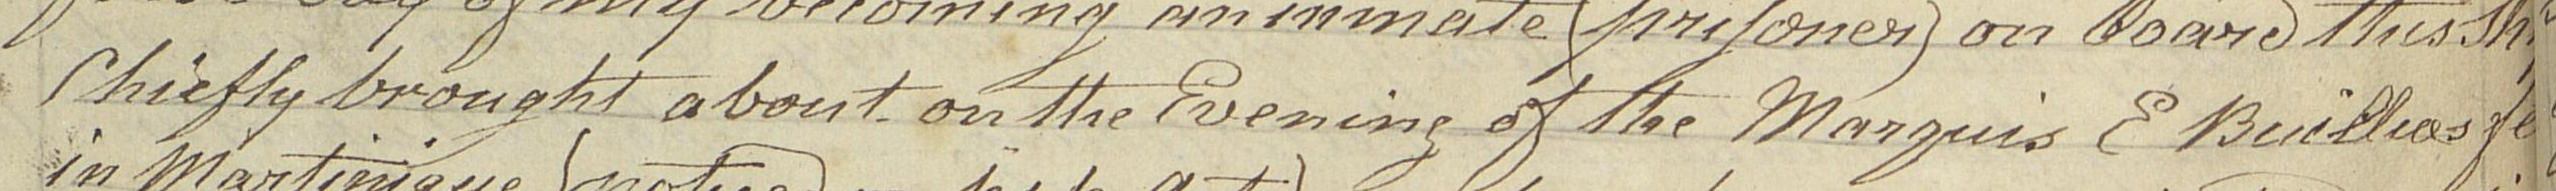chiefly brought about on the Evening of the Marquis E Builleas fe-
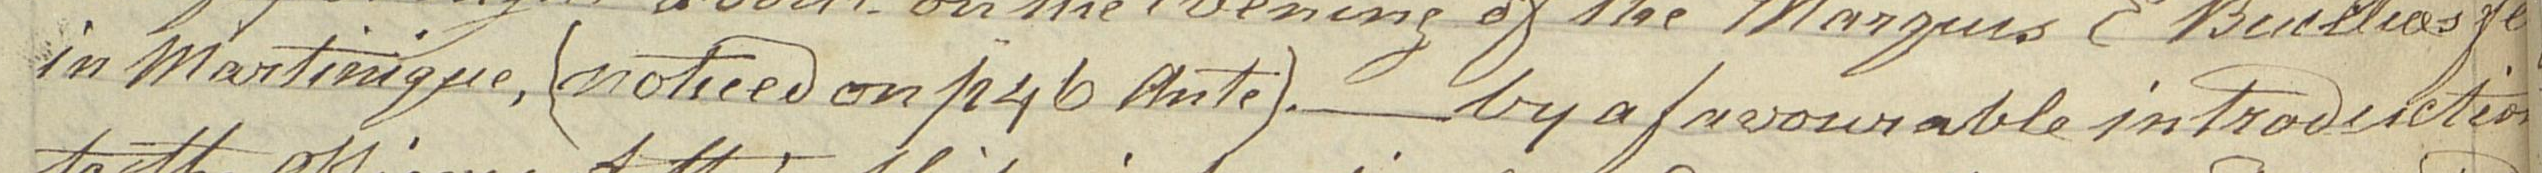in Martinique, (noticed on p46 Ante) by a favourable introduction
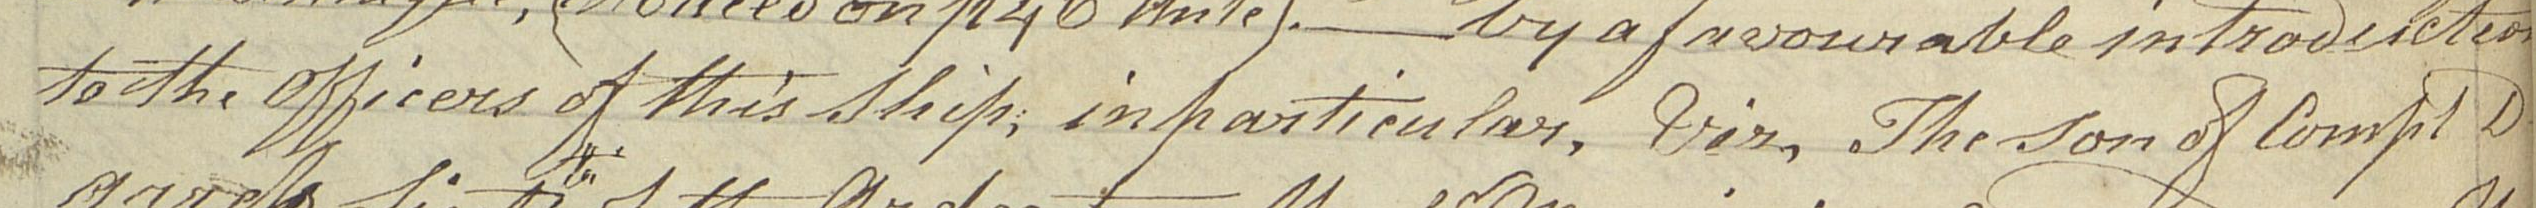to the Officers fo this Ship; in particular, Viz. The Son of Compl-
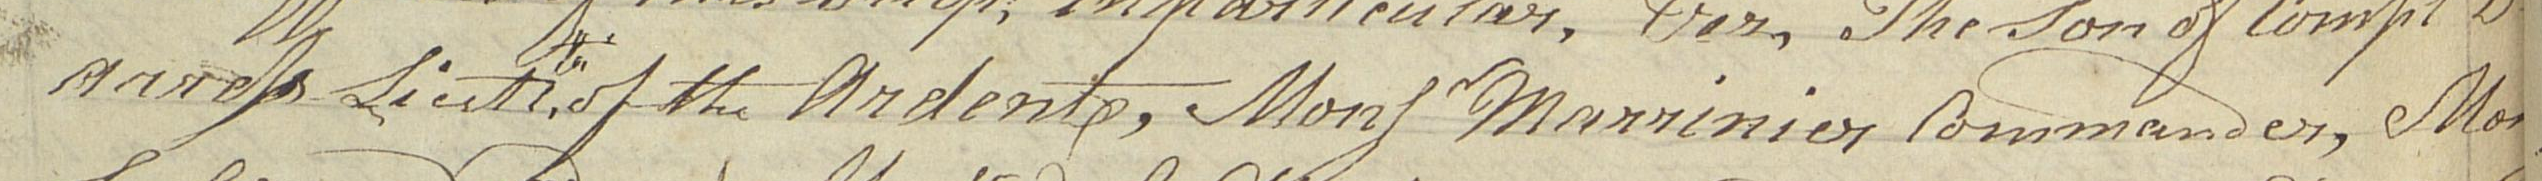Arross Lieut^t. of the Ardent, Mons^r. Marrinier Commander, Mo-
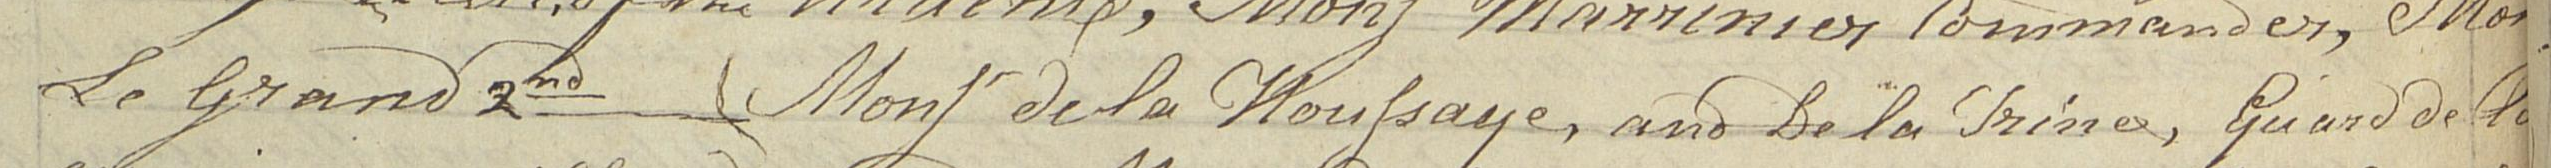Le Grand 2^nd (Mons^r de la Housqye, and De la Trina, Guard de P-
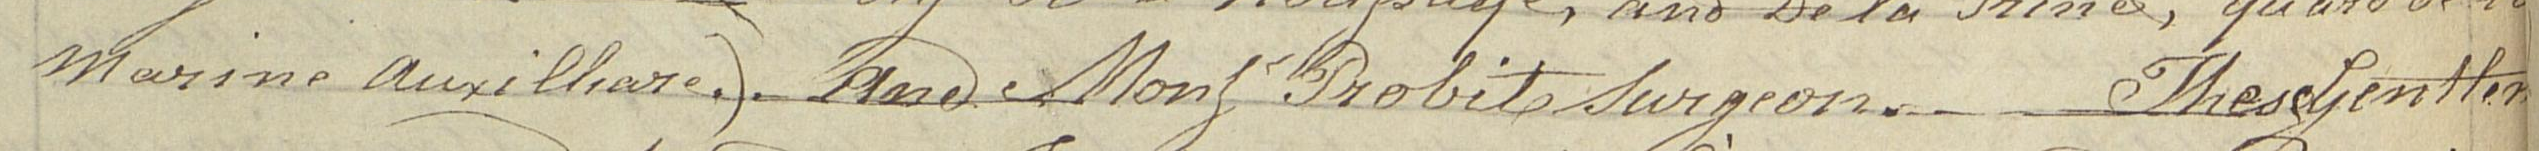Marine Auxillire.) And Mons^r. Probit Surgeon. These Gentlem-
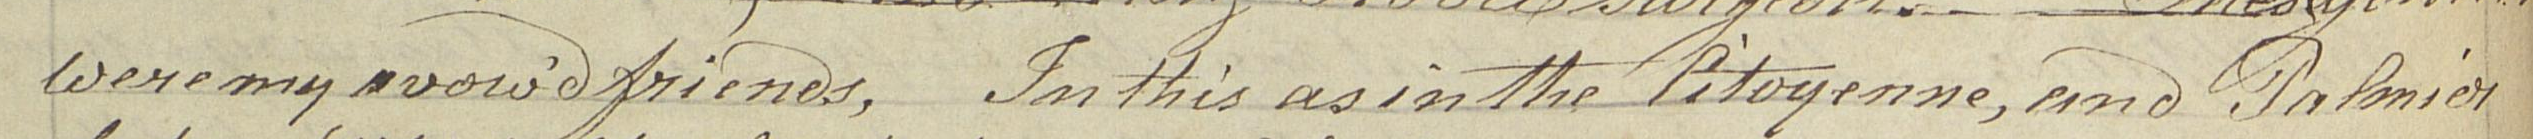were my avow'd friends, In this as in the Citoyenne, and Palmier
